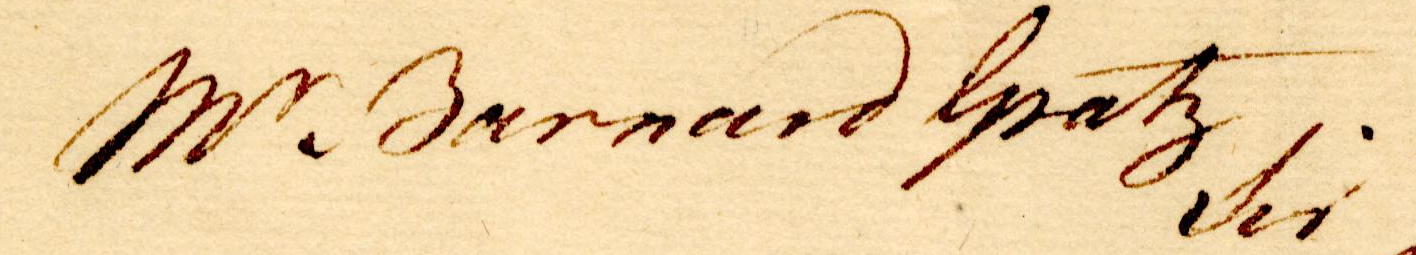M^r. Barnand Gratz
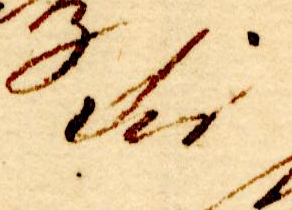Sir
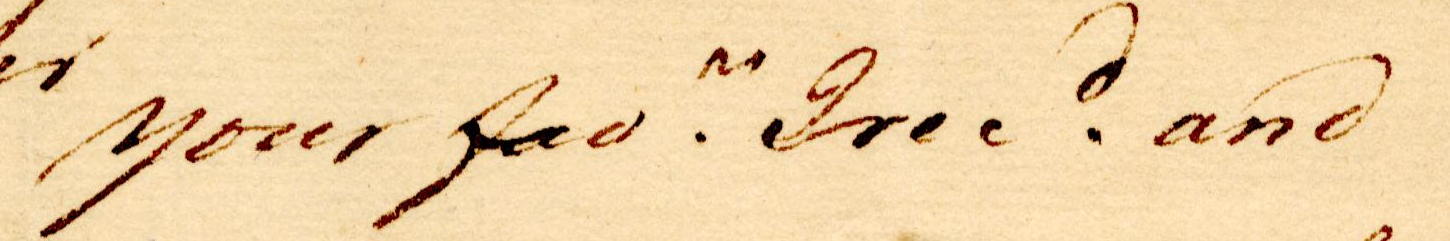your fav^r. I rec^d. and
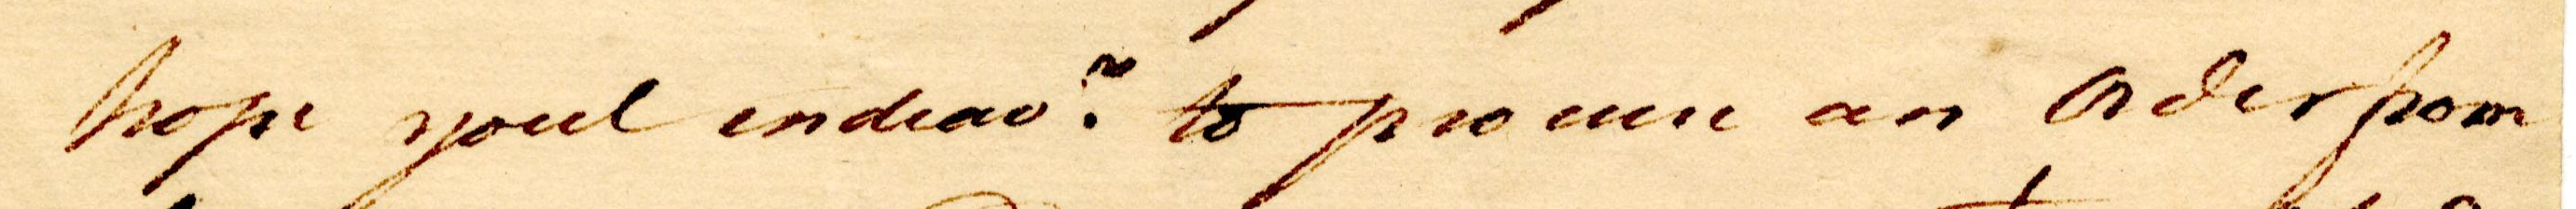hope youl endeav^r. to procure an order from
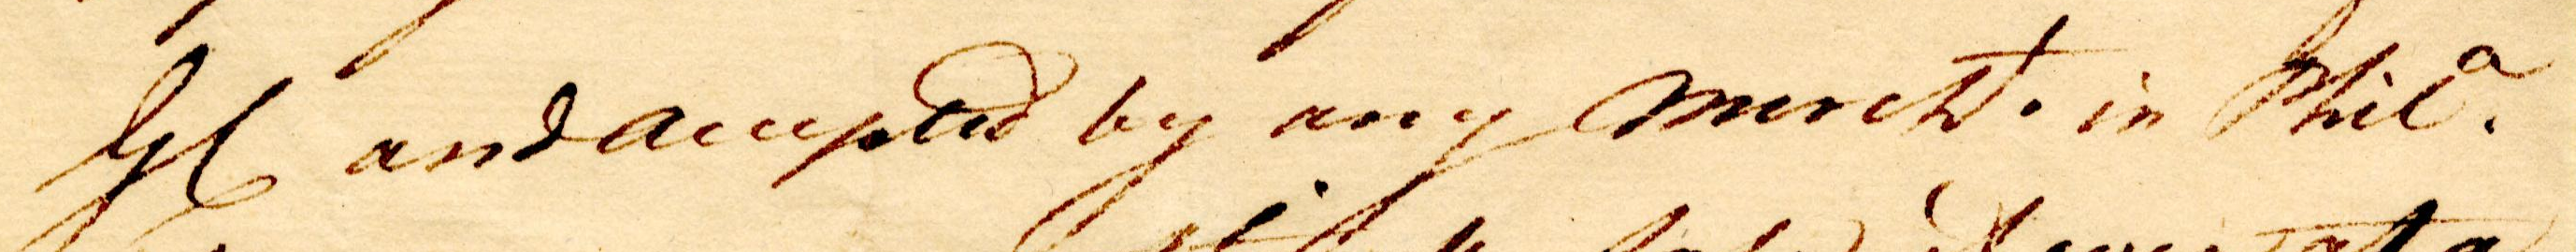GC and accepted by my merch^t. in Phil^a.
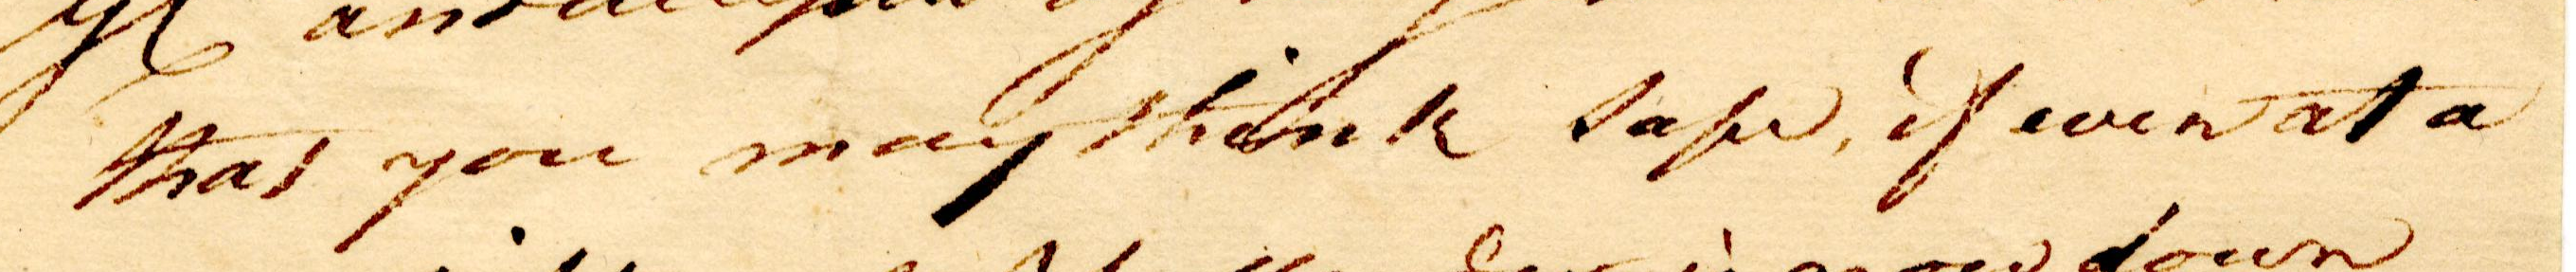that you may think safe, if even at a
